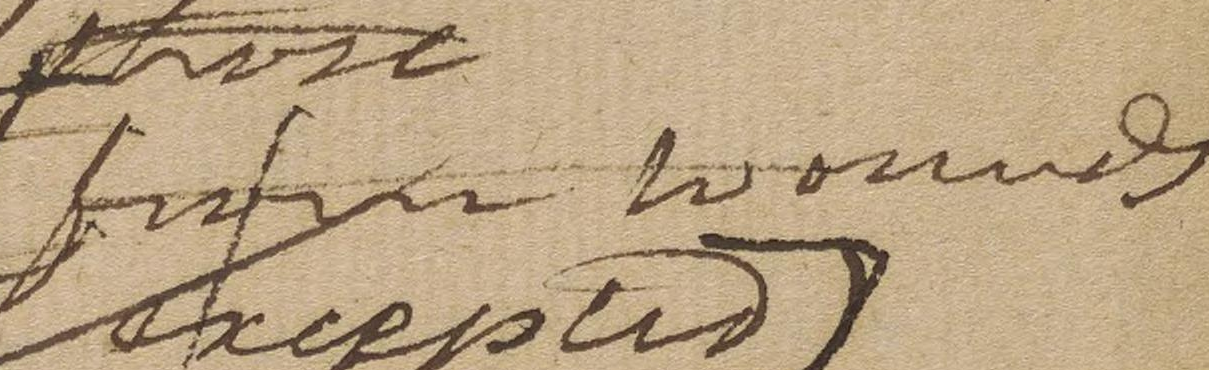from wounds
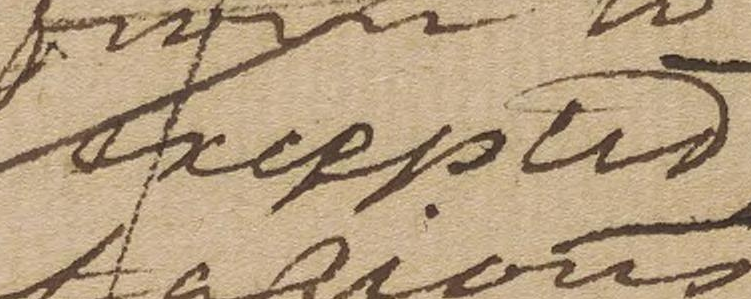excepted
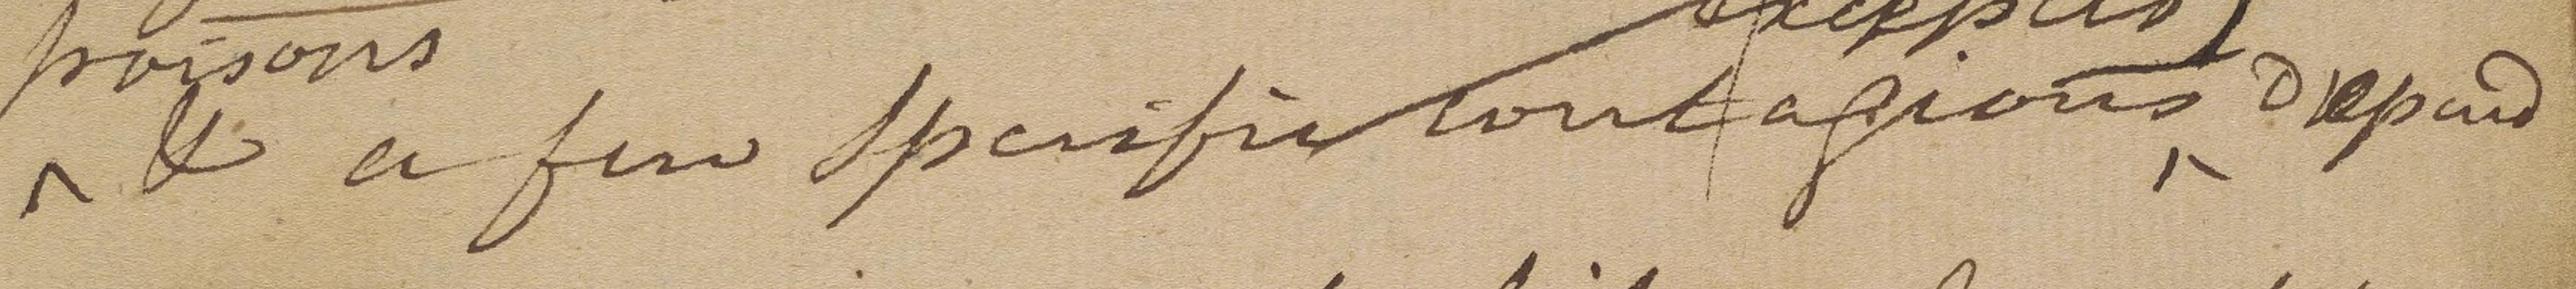^ & a few specific contagions ^ depend
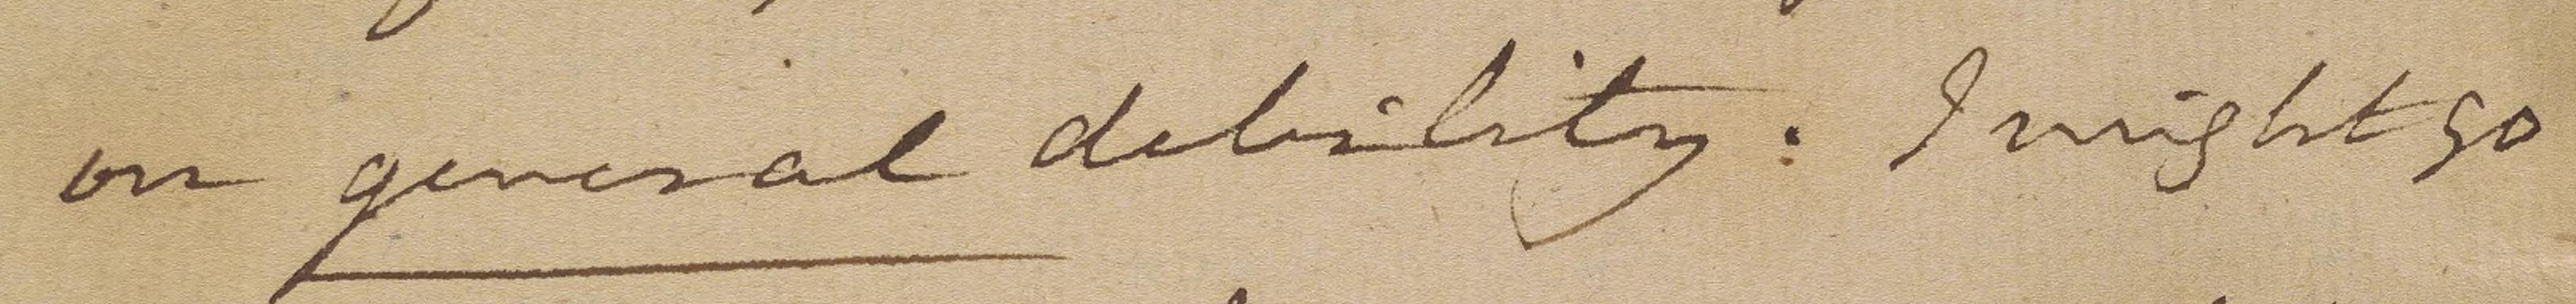on general debility. I might go
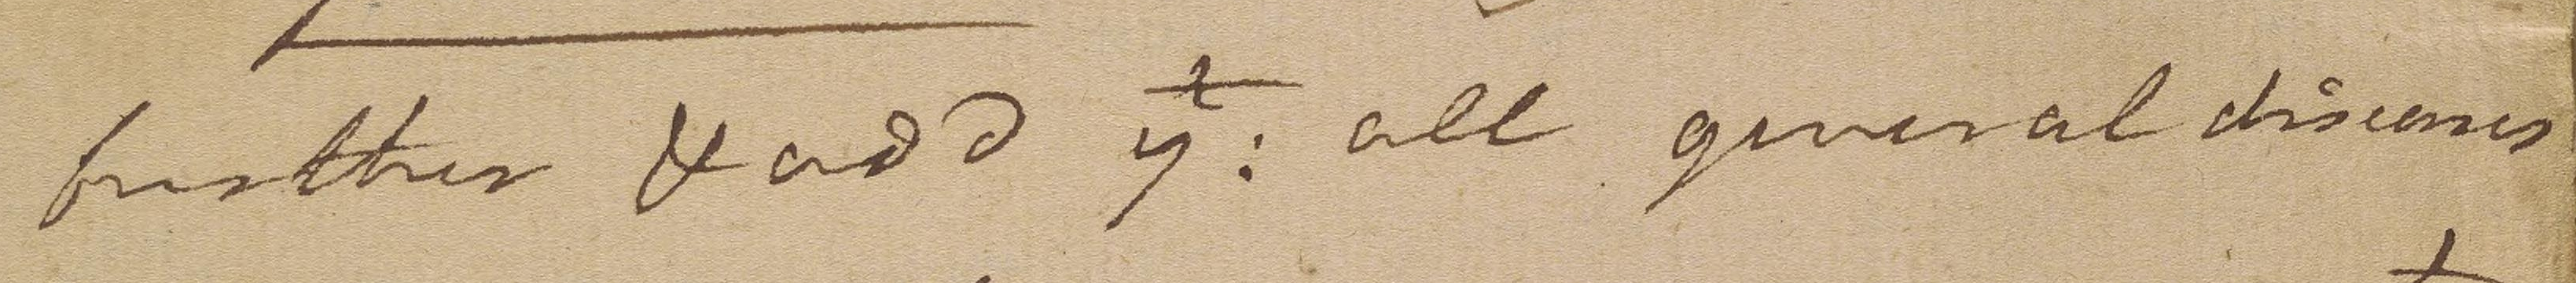further & add y^t: all general diseases
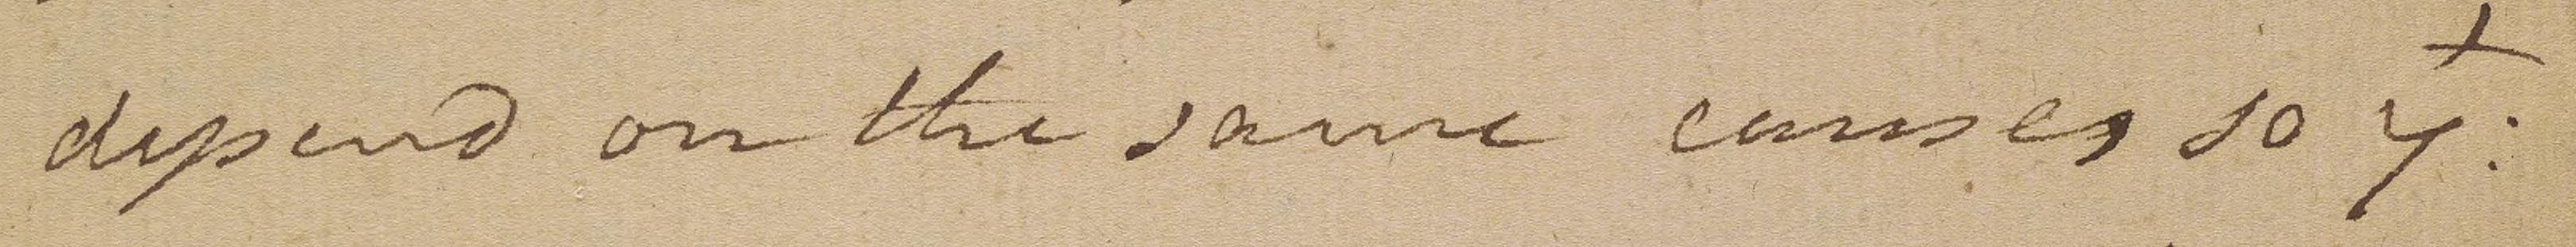depend on the same causes so y^t:
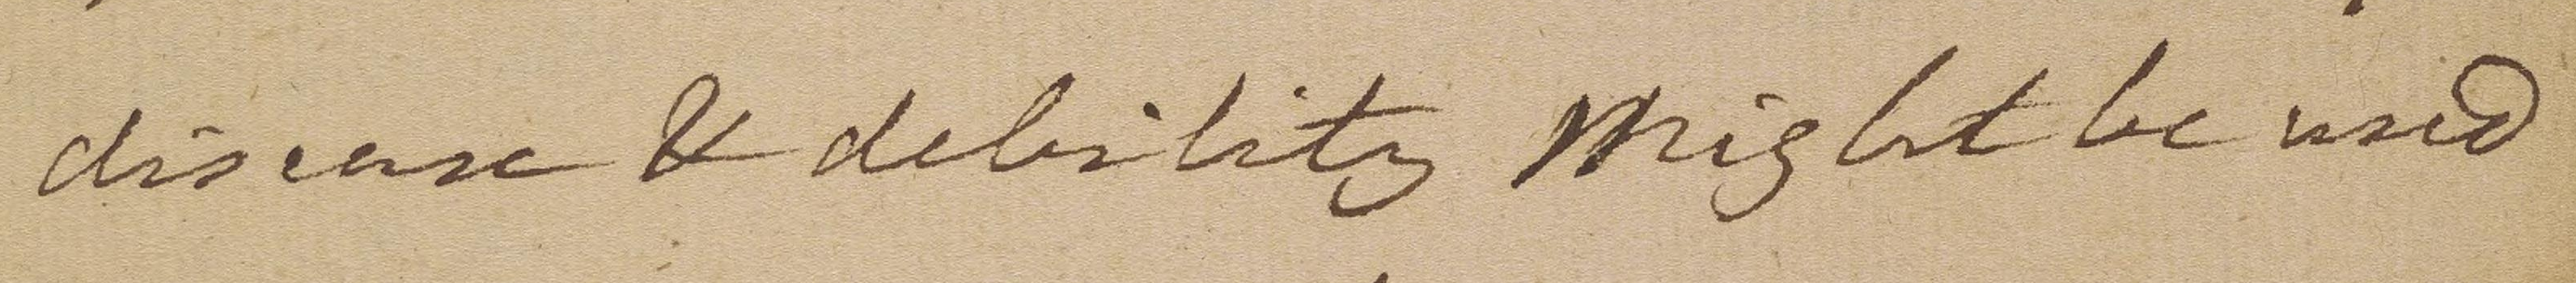disease & debility might be used
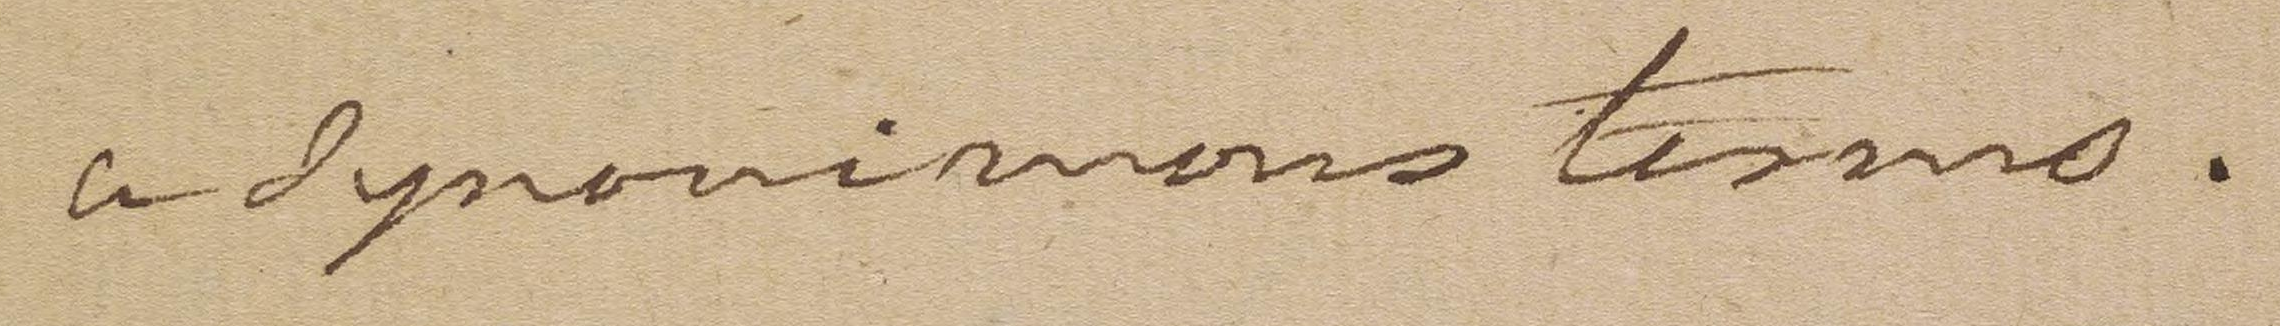a synonimous terms.
